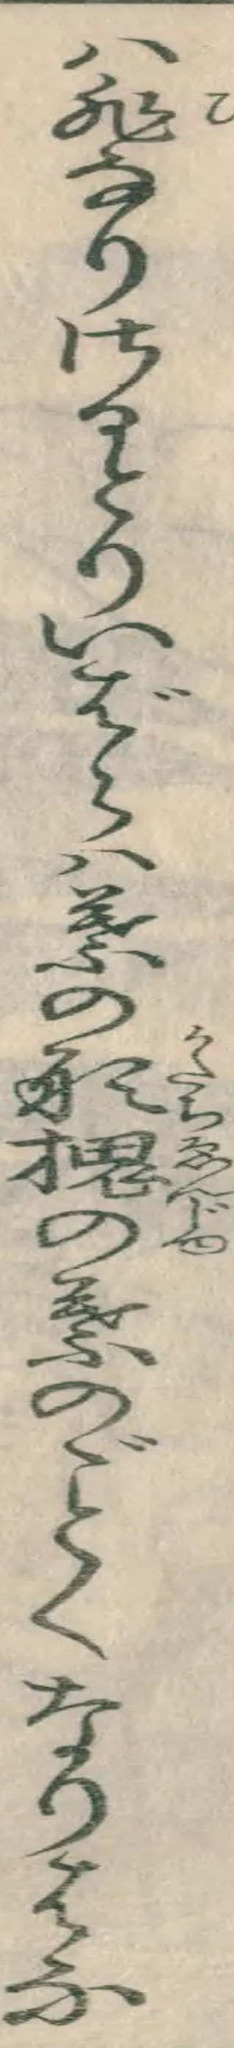は非なりさるとりいばらは葉の形槐の葉のごとくなりはな
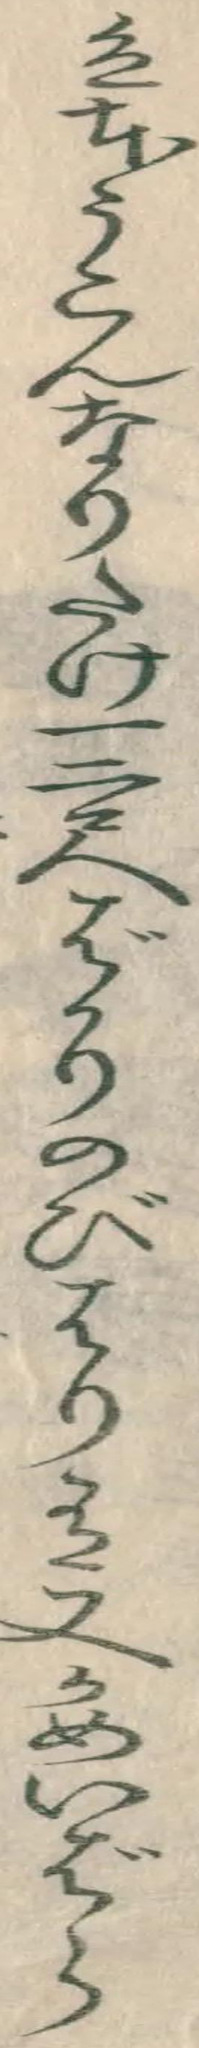色本うこんなりたけ一二尺ばかりのびはり有又かめいばら
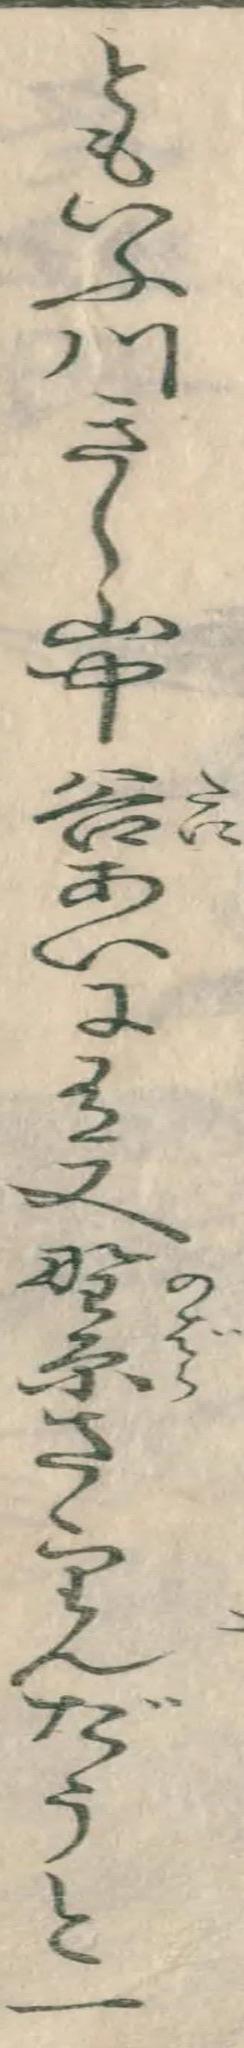ともいふ川きし山中谷あいに有又野原さゝりんだうと一
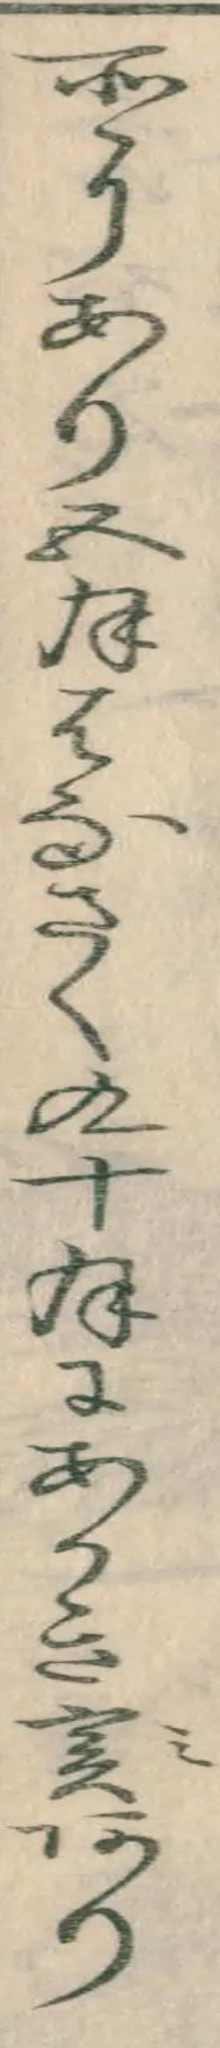所にあり五月はなさく九十月にあかき実あり

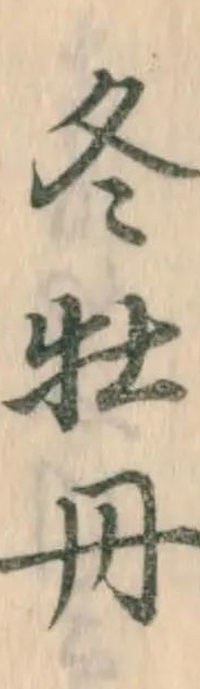冬牡丹
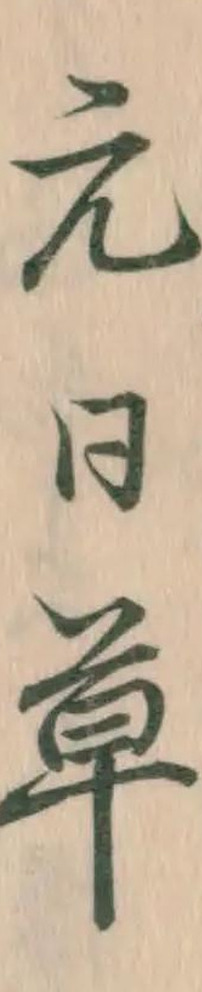元日草

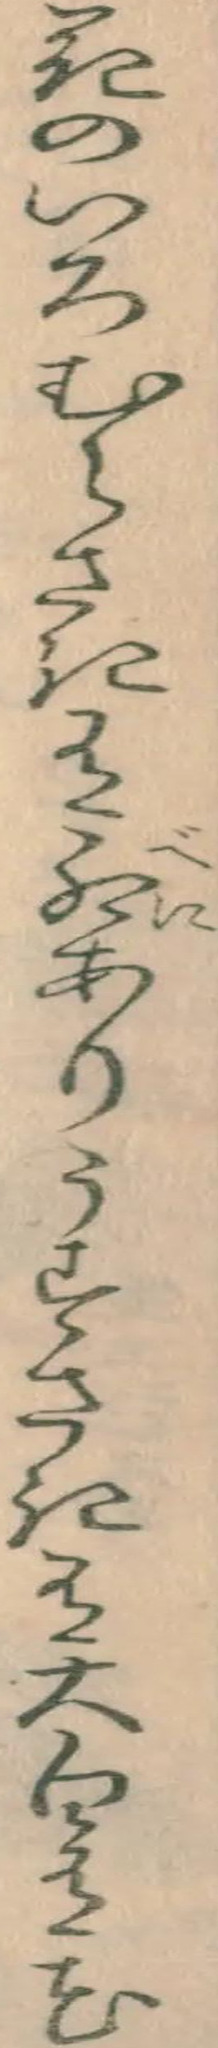花のいろむらさき有紅ありうすさき有大白有花
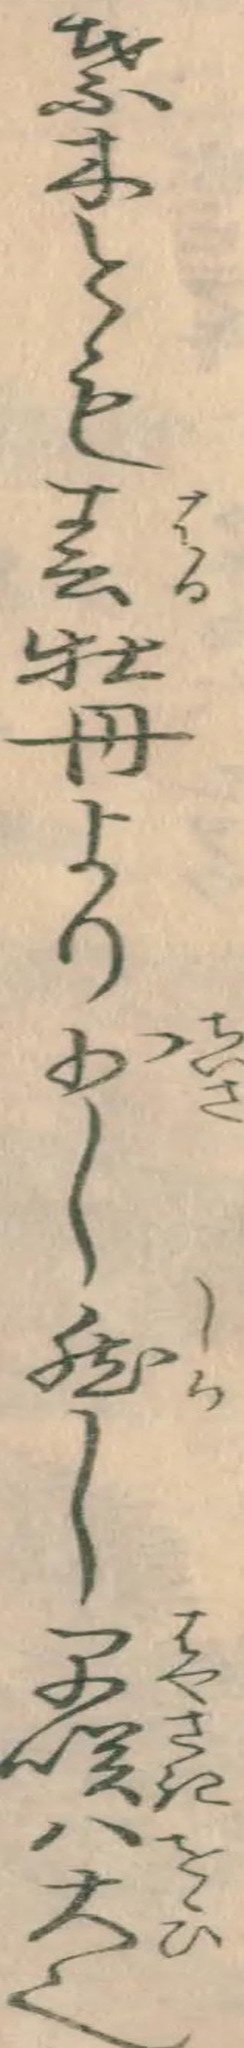葉木とも春牡丹より少し然し早咲は大也
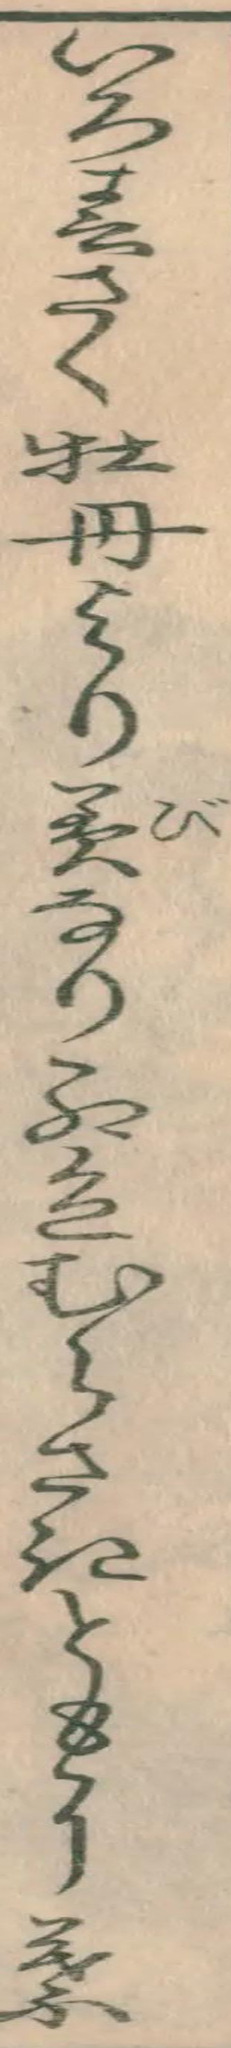いろ春さく牡丹より美なり紅色むらさきともに葉
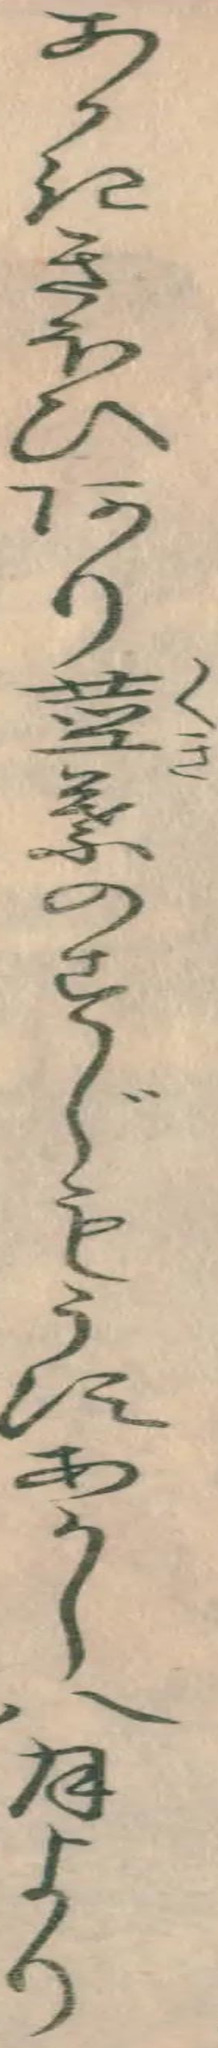あかききほひあり茎葉のすじもうすあかし八月より
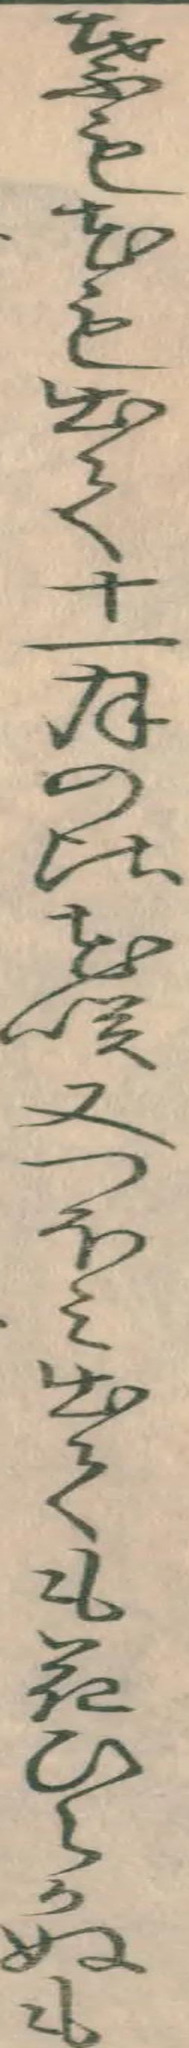葉も花も出て十一月の比花咲又つほみ出ても花ひらかぬも
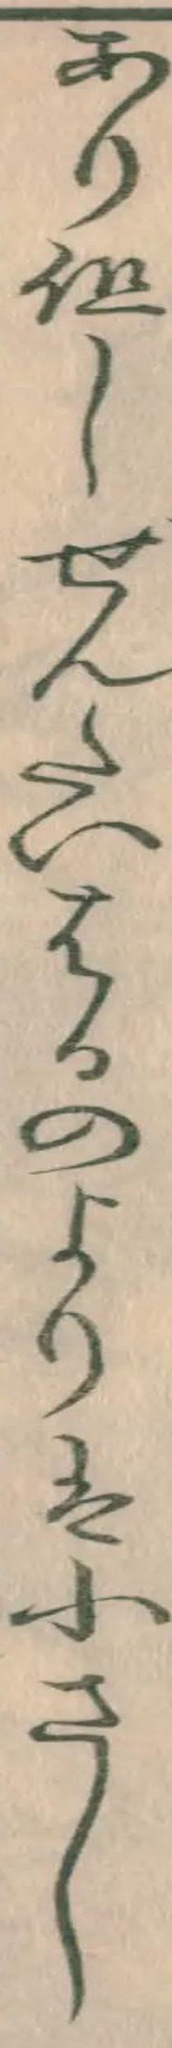あり但しぜんたいはるのよりは小さし
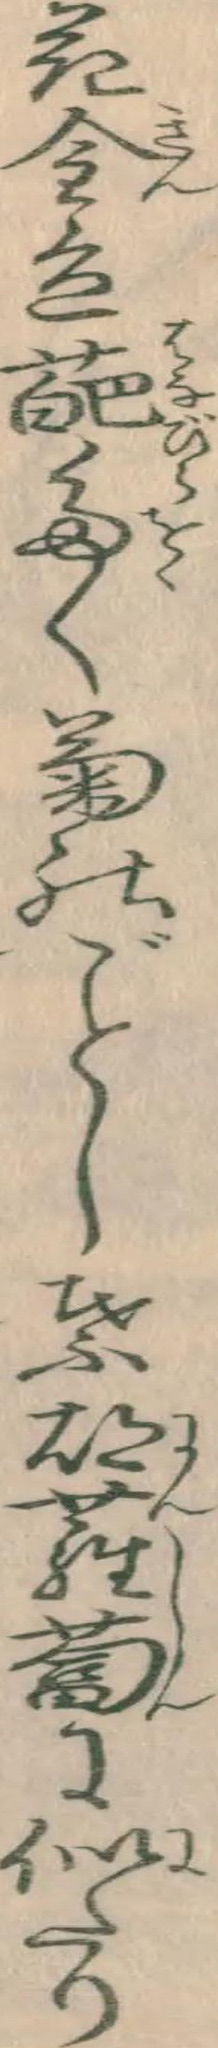花金色葩多く菊のごとし葉胡蘿蔔に似たり
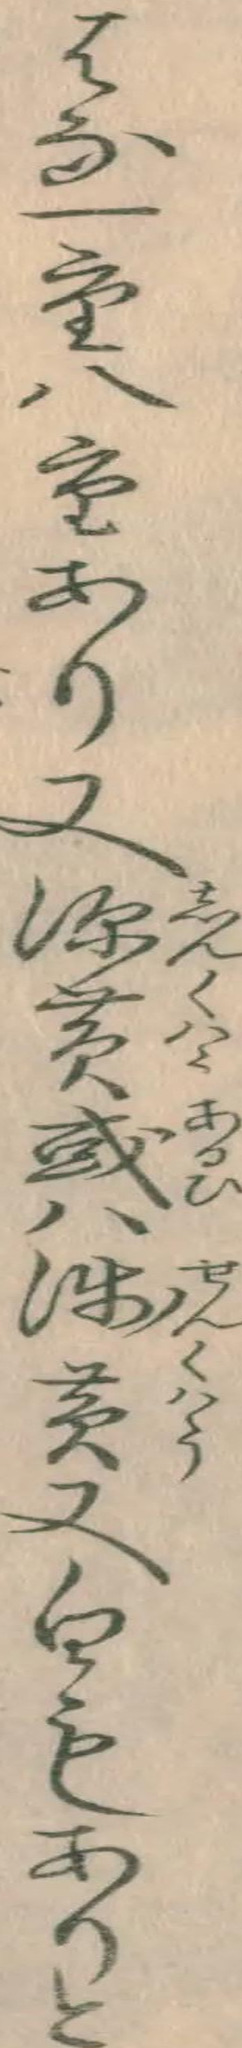はな一重八重あり又深黄或は浅黄又白もありと
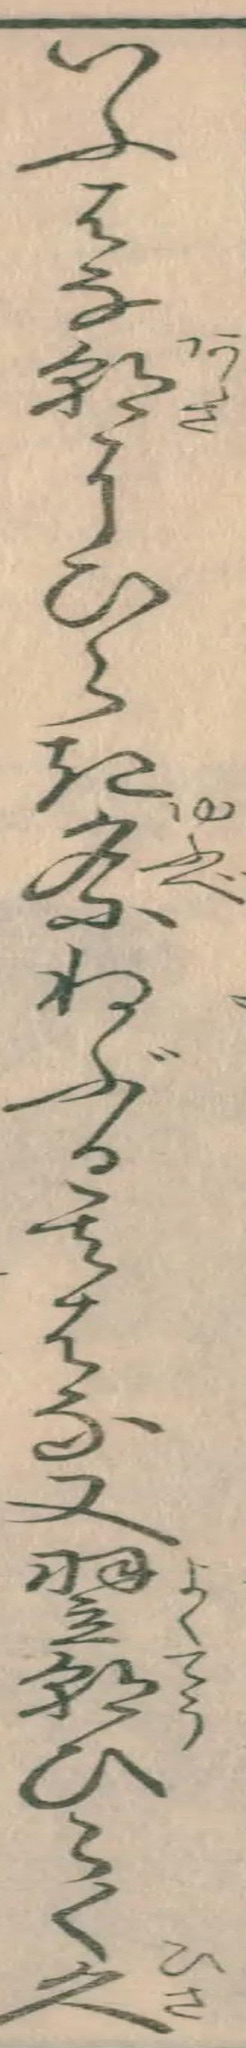いふはな朝にひらき夕にねぶる其はな又翌朝ひらく久
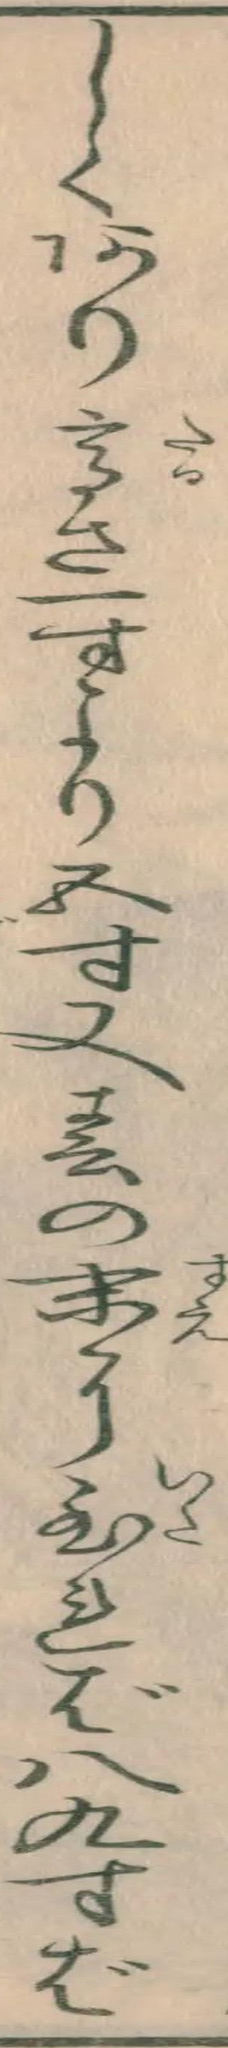しくあり高さ一寸より五寸又春の末に至れば八九寸ば
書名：畫本野山草. [4]
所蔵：国立国会図書館 National Diet Library, JAPAN
